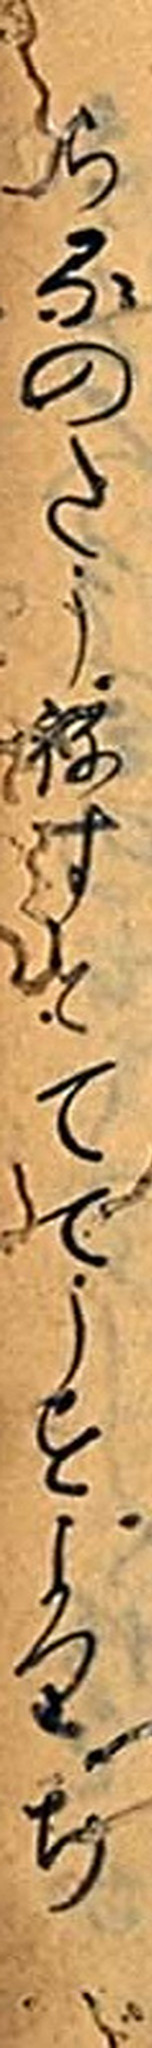らるのたうねすとててうすよりち

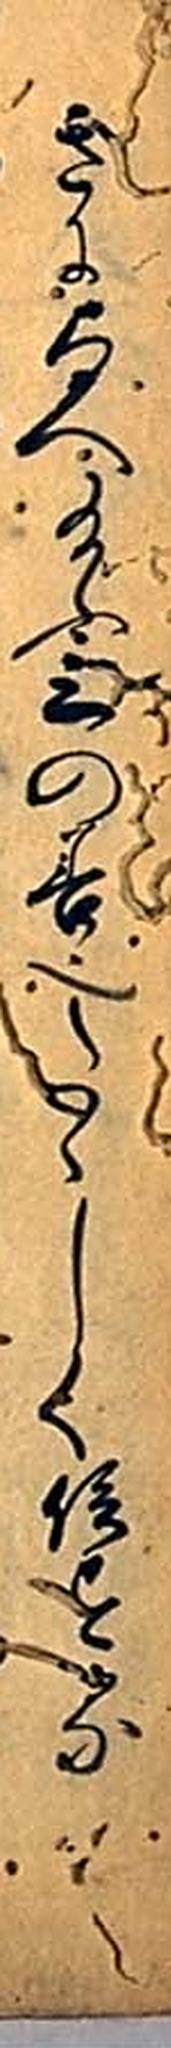きに与へ給ふ三の善也たゝしく信する
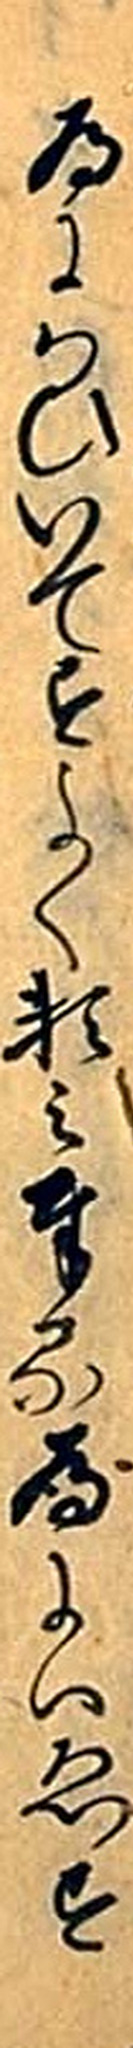為にはひいてすよく頼み奉る為にはゑす
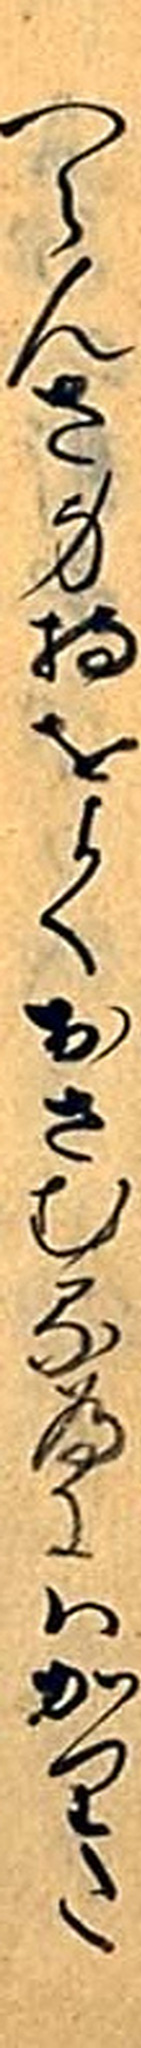へらんさ身持をよくおさむる為にはかりた
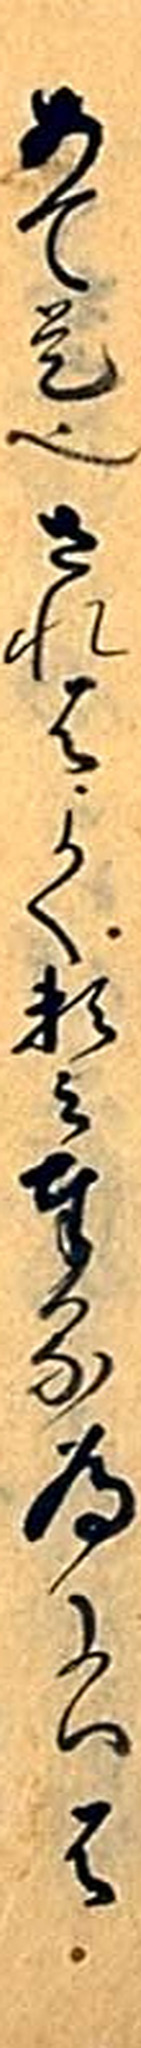あて是也されはよく頼み奉る為にはは
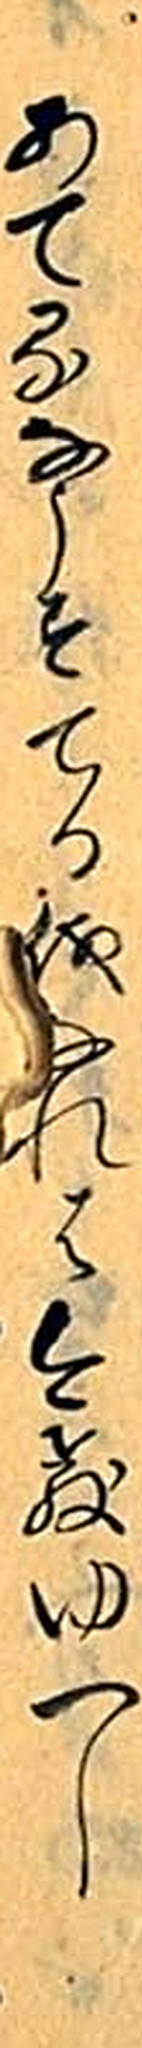あてるなうすてる儀なれは今教ゆへし
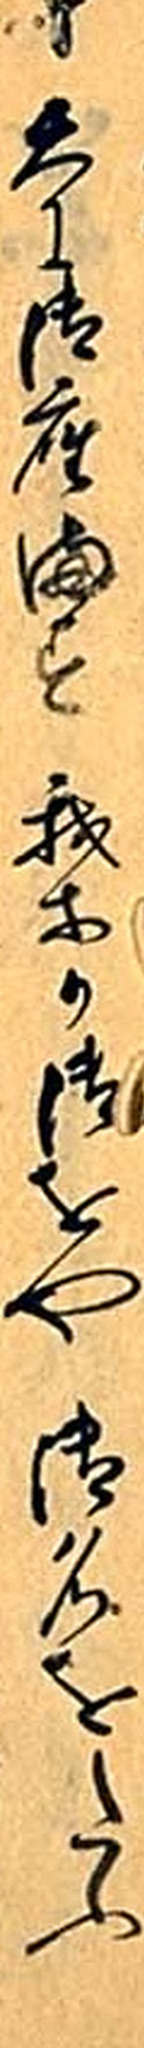天に御座ます我等か御をや御名をたふ
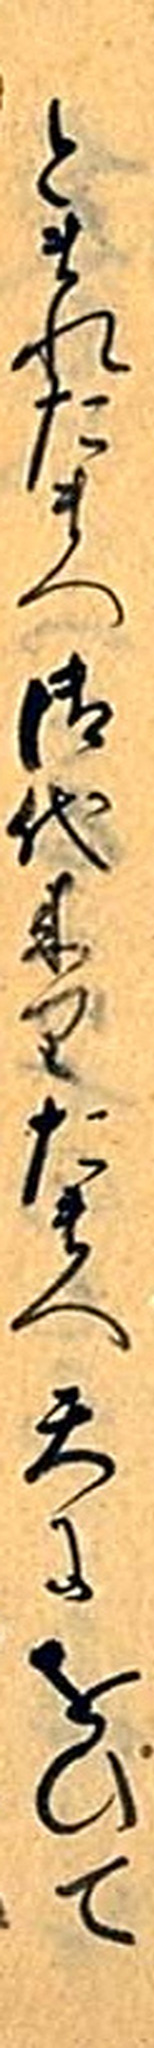とまれたまへ御代来りたまへ天にをひて
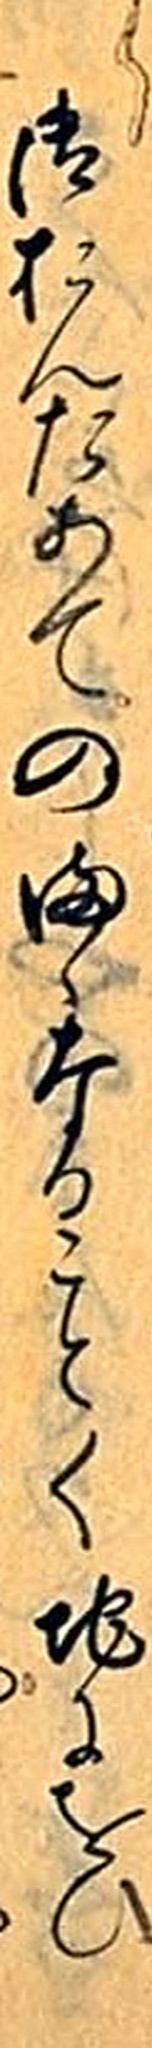御おんたあてのまゝなることく地にをひ
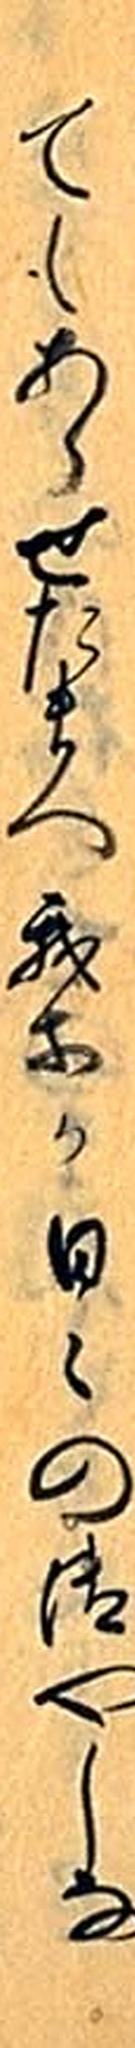てもあらせたまへ我等か日々の御やしな
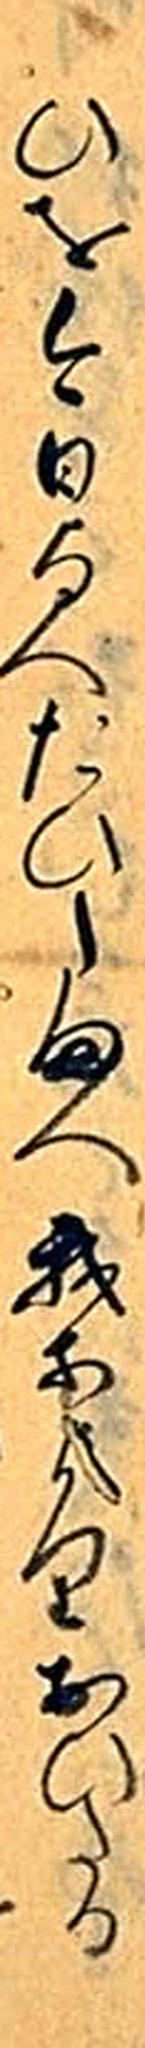ひを今日与へたひたまへ我等よりおひたる
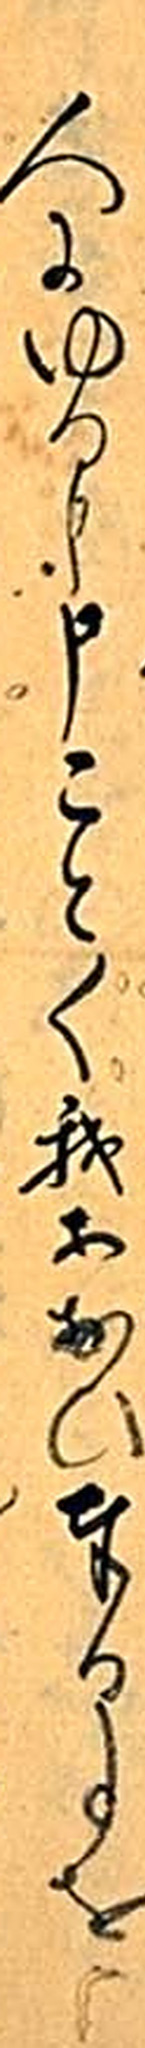人にゆるし申ことく我等おひ奉る事を
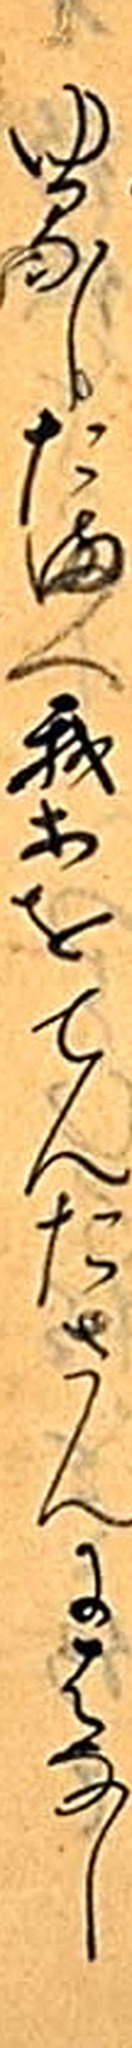ゆるしたまへ我等をてんたさんにはなし
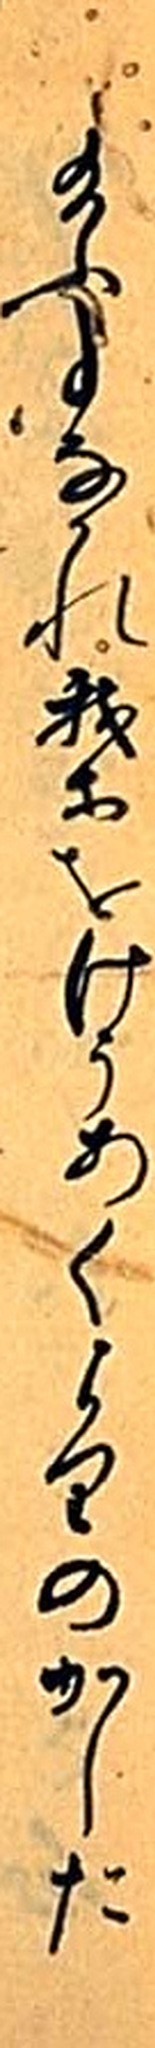給ふ事なかれ我等をけうあくよりのかした
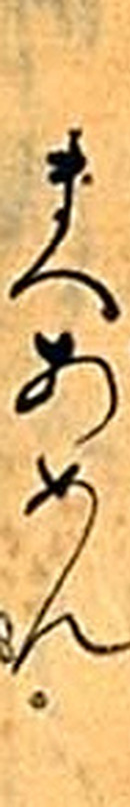まへあめん
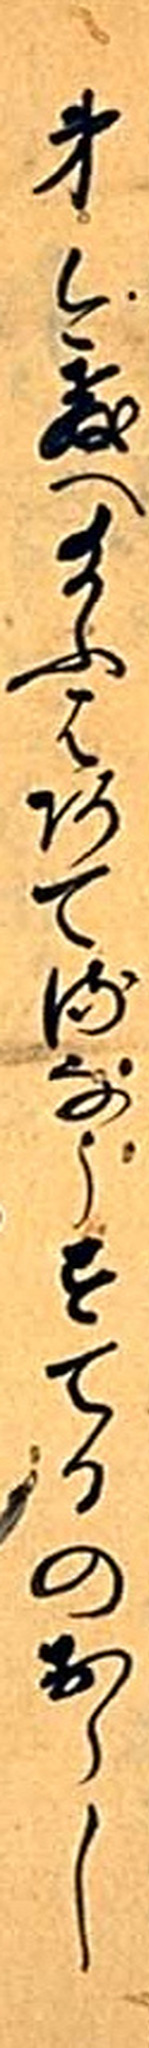弟今教へ給ふはあてるなうすてるのおらし
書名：ドチリナ・キリシタン
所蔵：東京大学総合図書館 / General Library in the University of Tokyo
